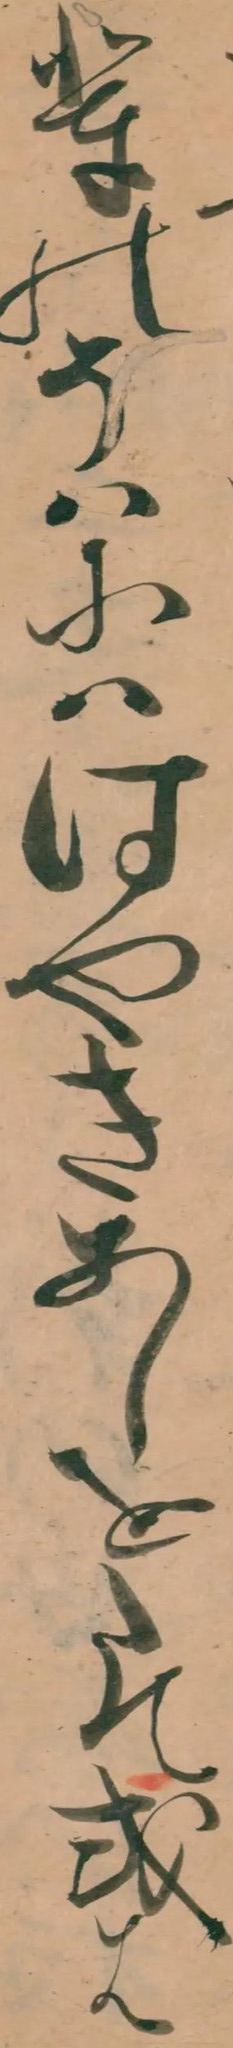輩のそハにハはやきあしをたて或は
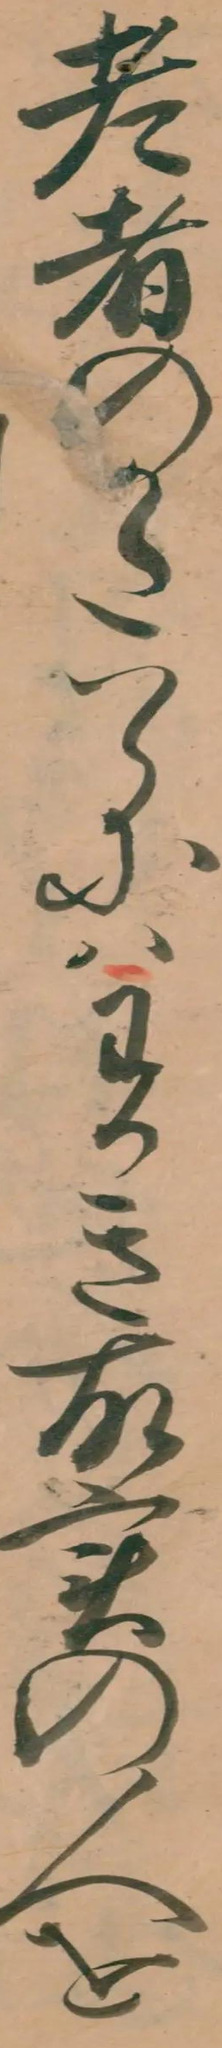老者のかたハらにハわかき故実の人を
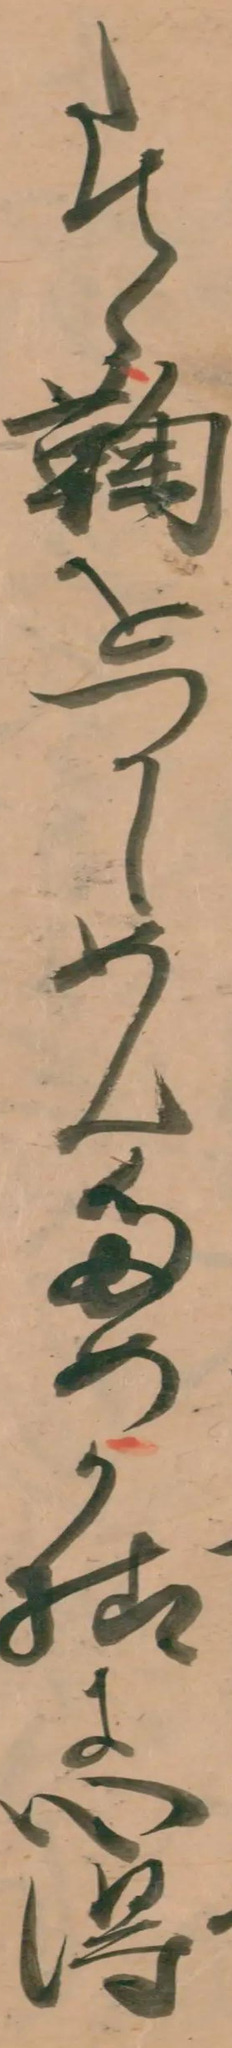たてゝ鞠をつかしめんためか様に心得
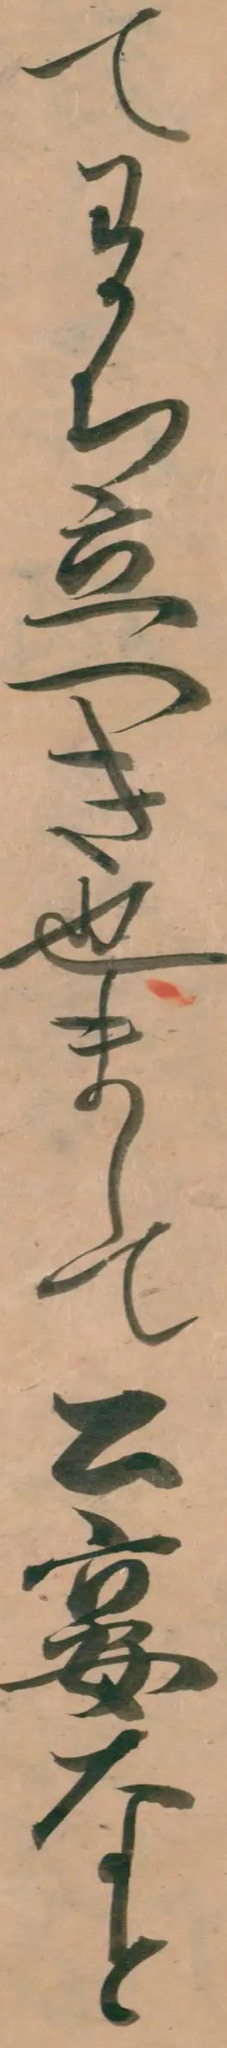てわかち立へき也まして公宴なと
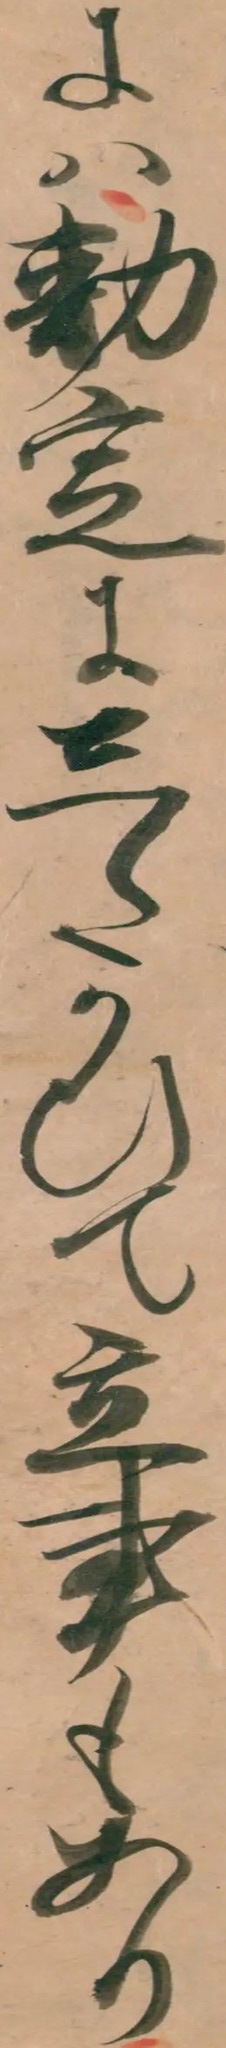にハ勅定にしたかひて立事もあり
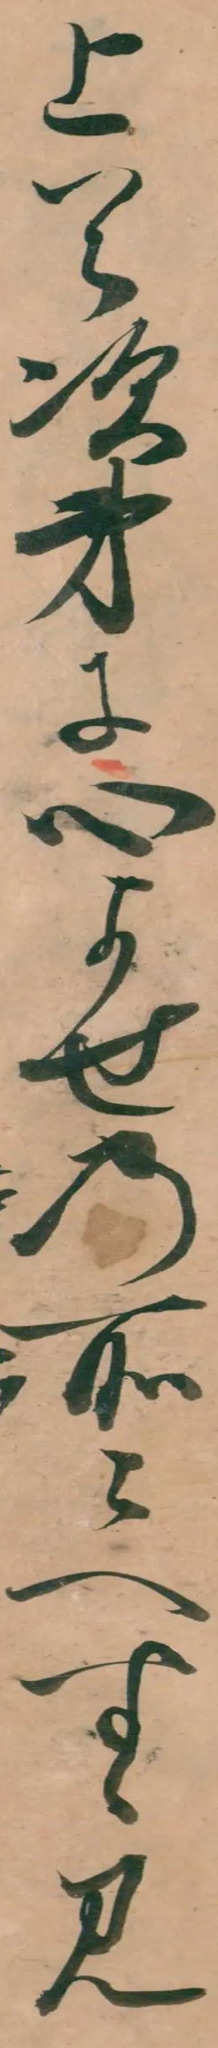上いち次第に心よせの所々へすゝみ
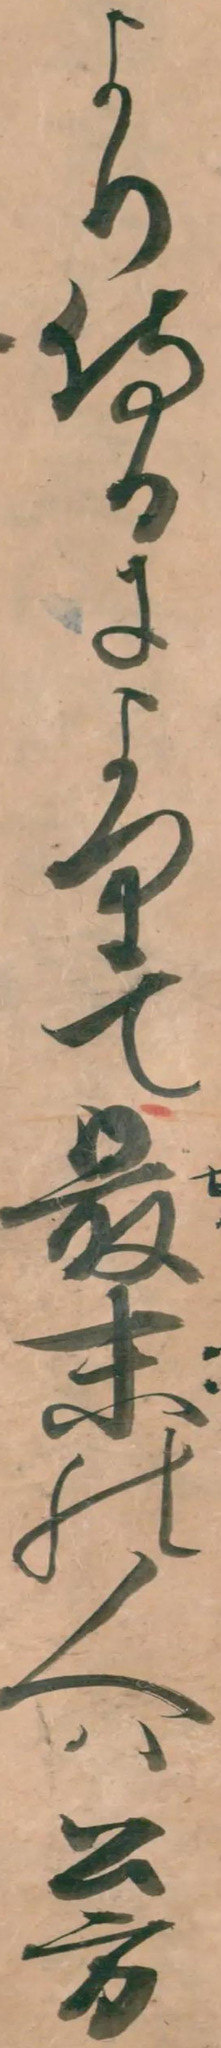より侍るによりて最末の人ハ公方
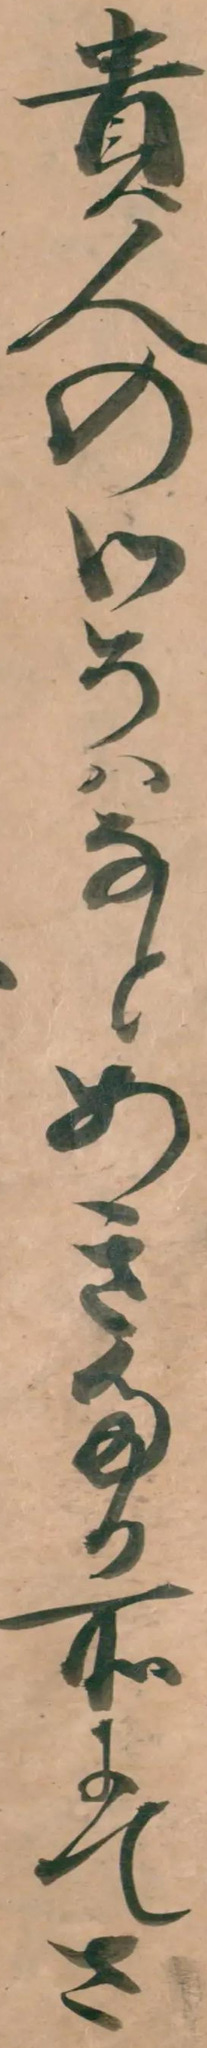貴人の御そハなとあきたる所にてさ
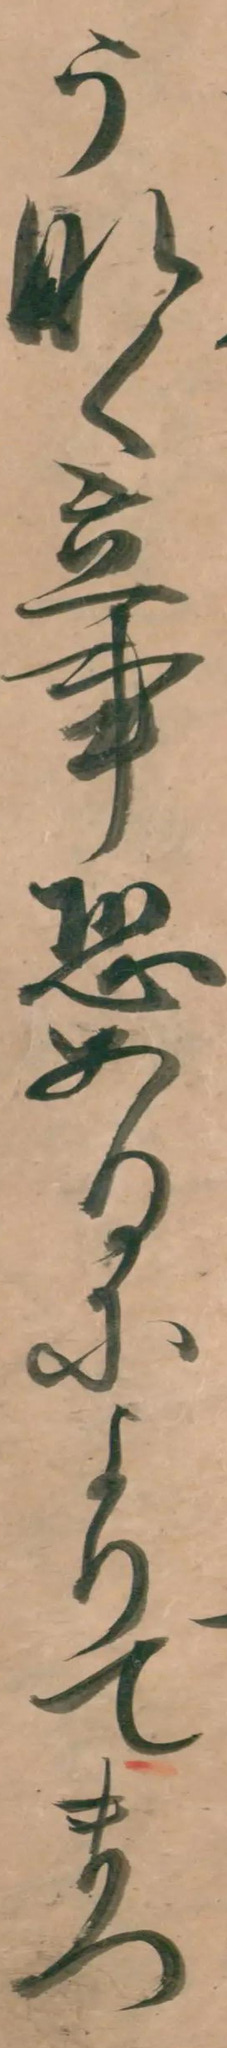うなく立事恐あるによりてまつ
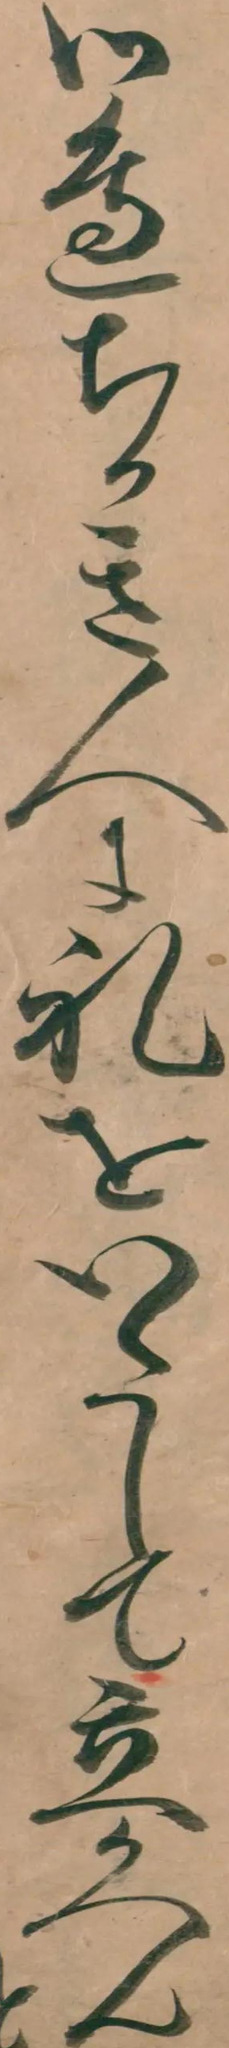御辺ちかき人に礼をいたして立かへんと

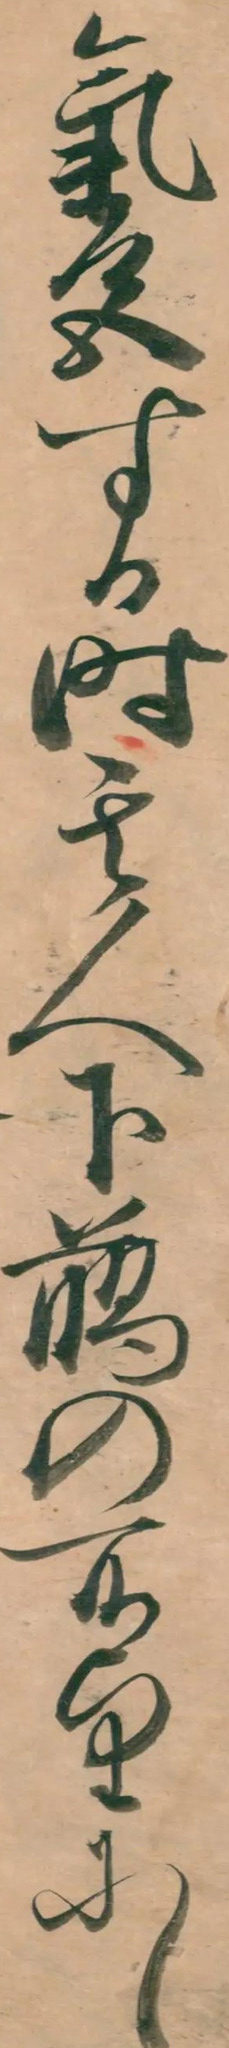気色する時其人下臈の所望にし
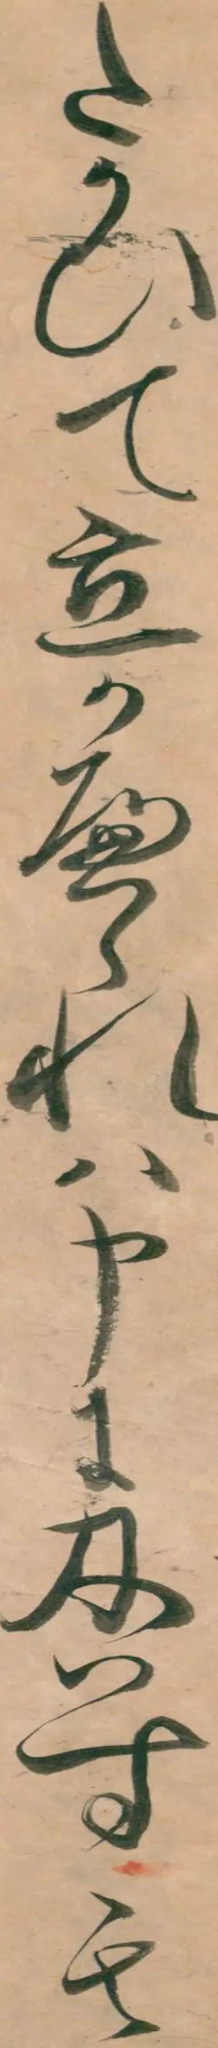たかひて立かへられハ申に及ハす其
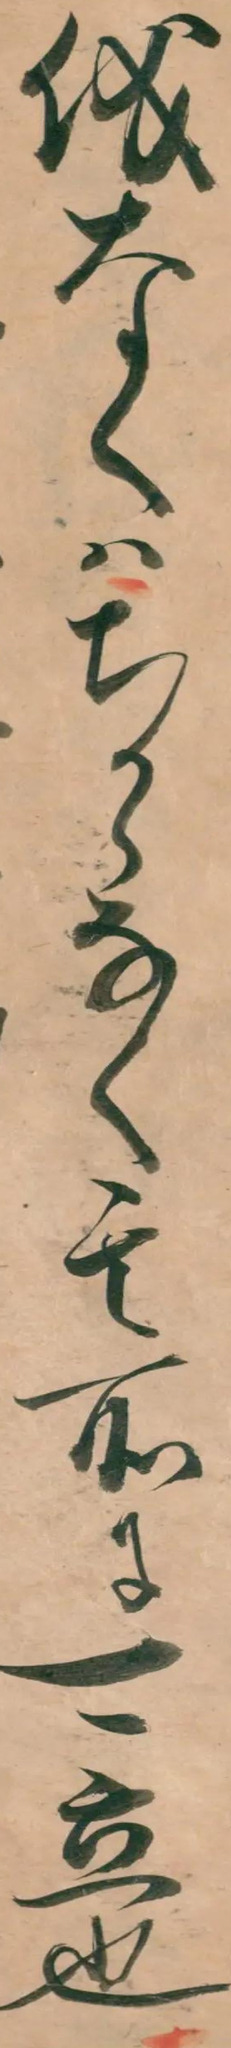儀なくハちからなく其所に可立也
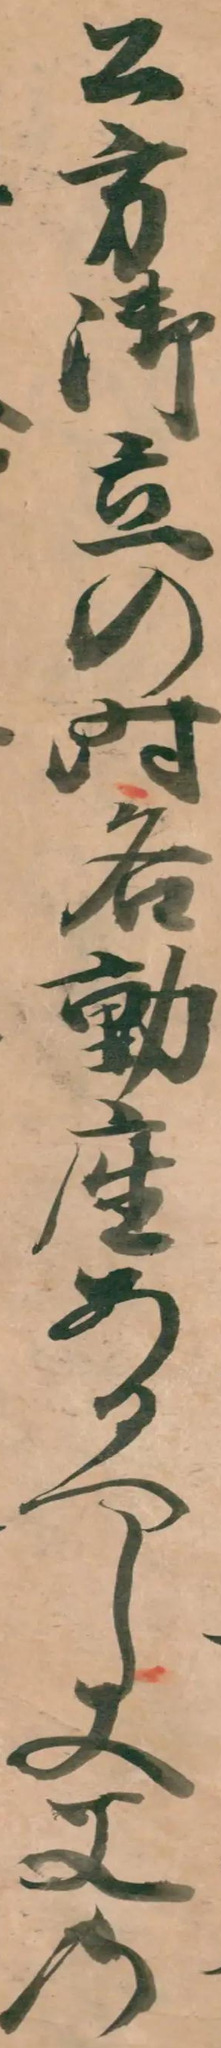公方御立の時各動座あるへし又丈の
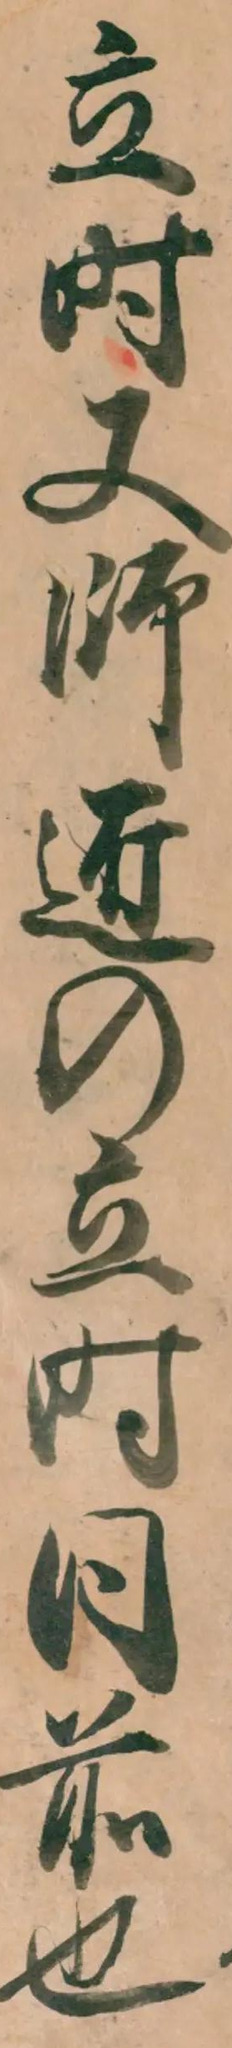立時又師匠の立時同前也
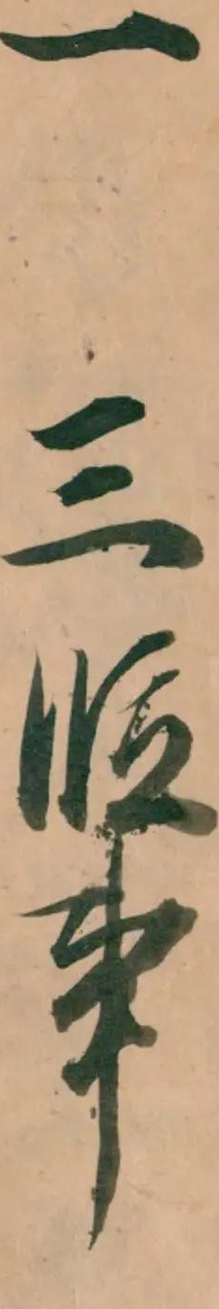一三段事
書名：蹴鞠之条々大概
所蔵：国立国会図書館 National Diet Library, JAPAN
